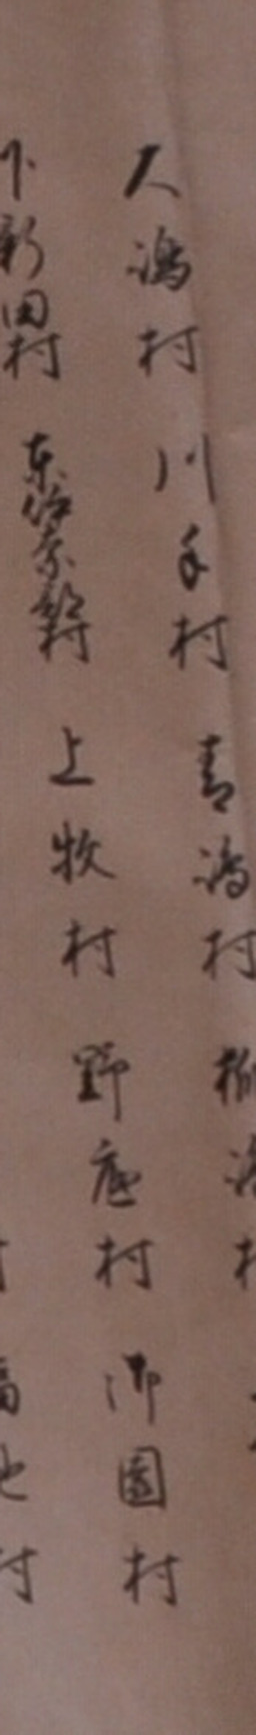下新田村東伊奈部村上牧村野底村御園村
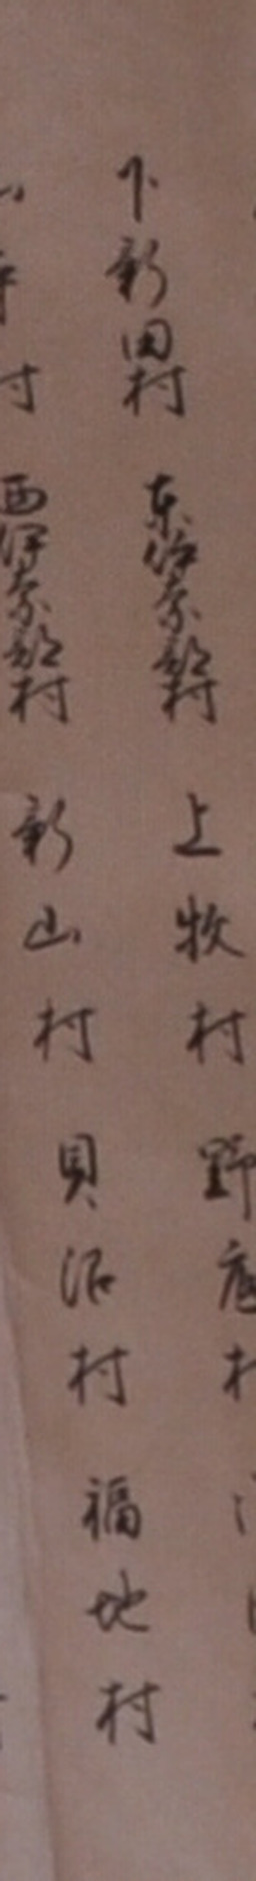山寺村西伊奈部村新山村貝沼村福地村
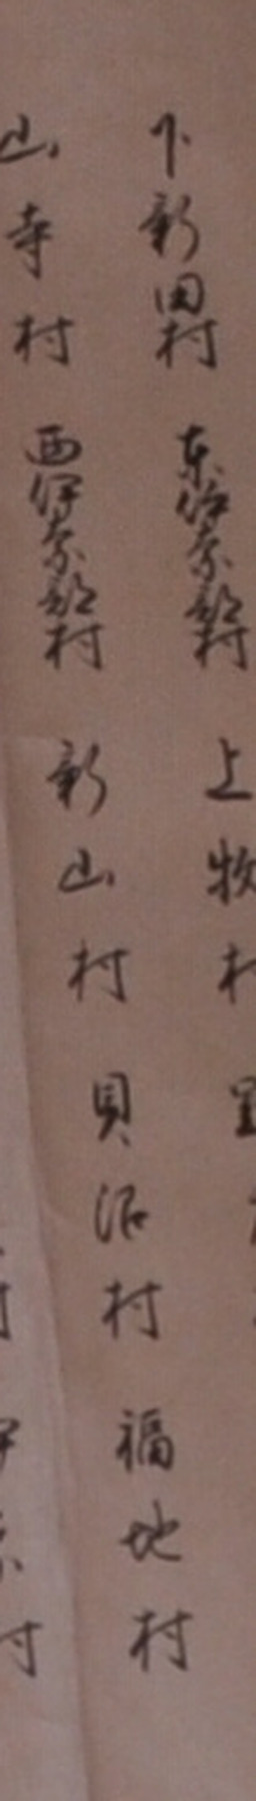山寺村西伊奈部村新山村貝沼村福地村
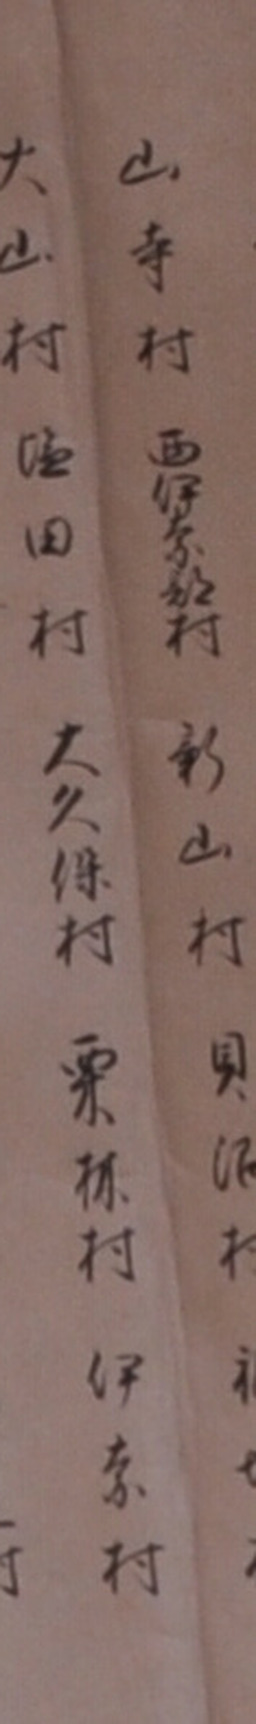火山村塩田村大久保村栗林村伊奈村
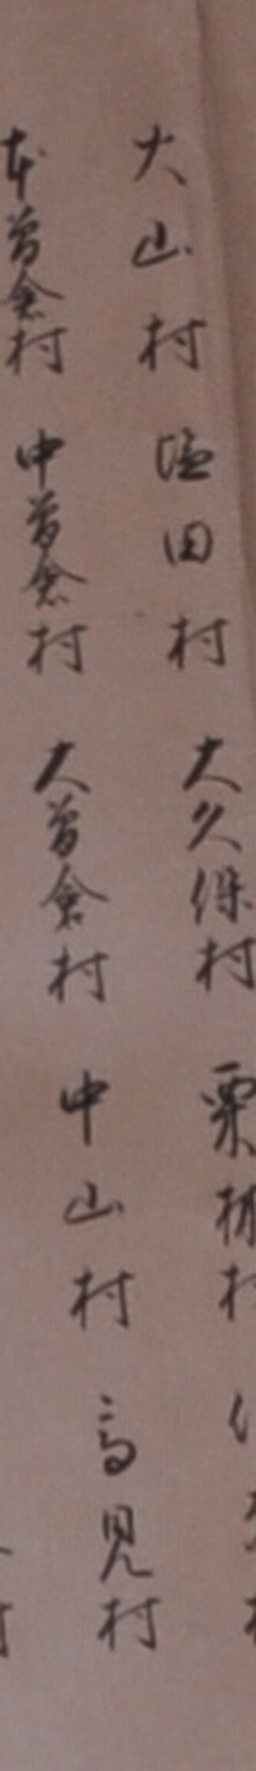本曽倉村中曽倉村大曽倉村中山村高見村
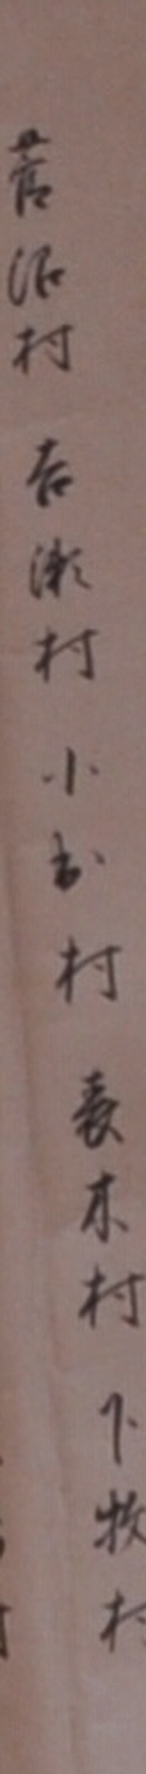菅沼村吉瀬村小出村表木村下牧村
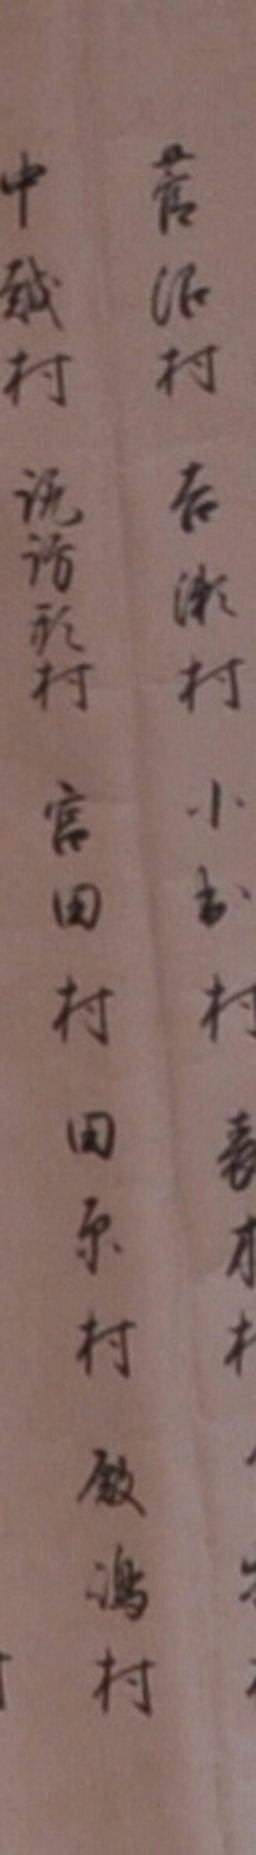中越村諏訪形村宮田村田原村殿島村
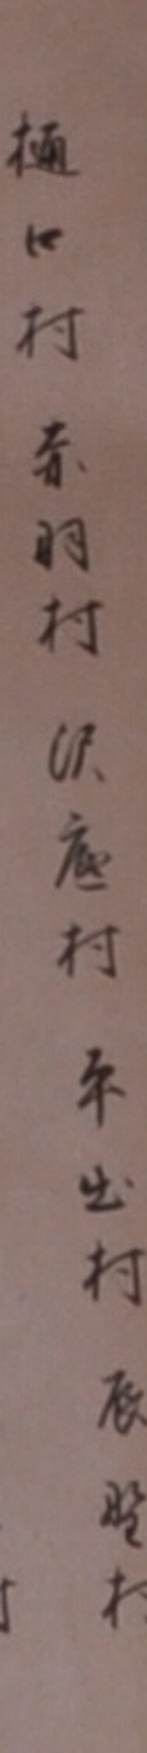樋口村赤羽村沢底村平出村辰野村
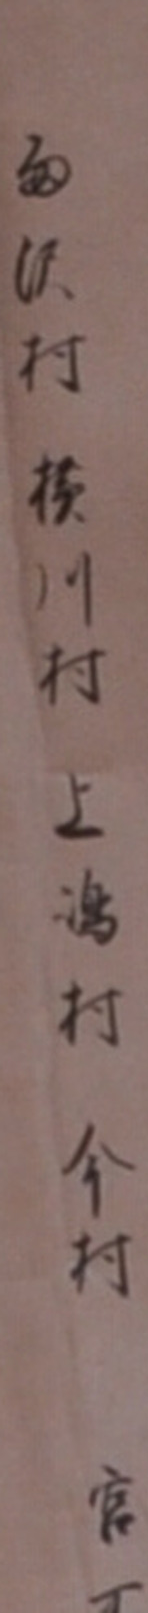雨沢村横川村上島村今村宮所村
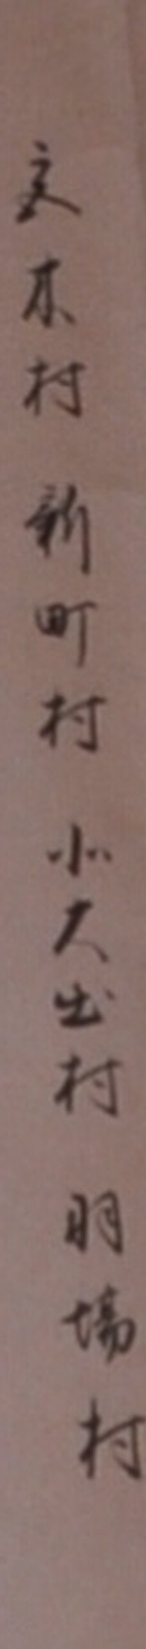宮木村新町村北大出村羽場村
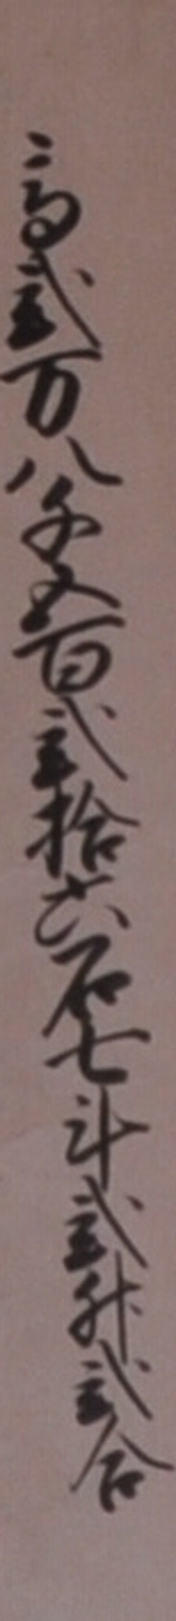高弐万八千五百弐拾六石七斗弐升弐合
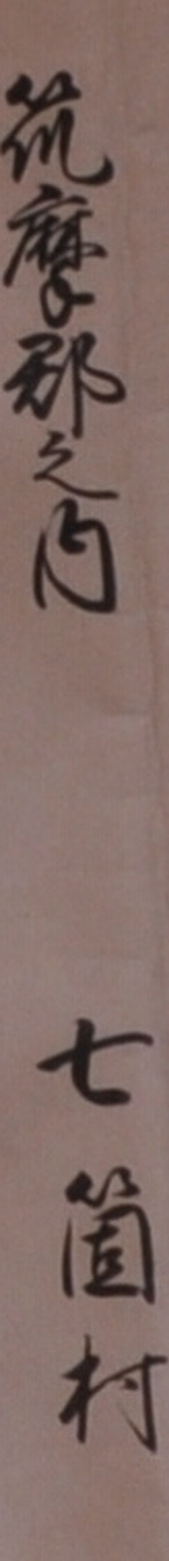筑摩郡之内七箇村
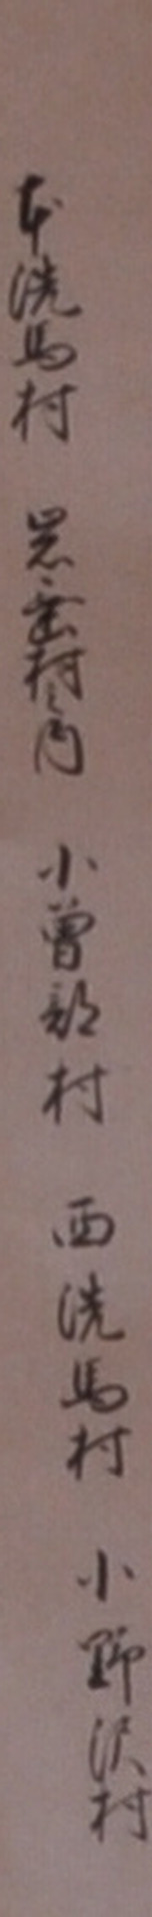本洗馬村岩垂村之内小曽部村西洗馬村小野沢村
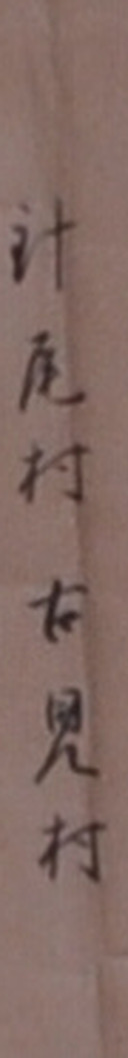針尾村古見村
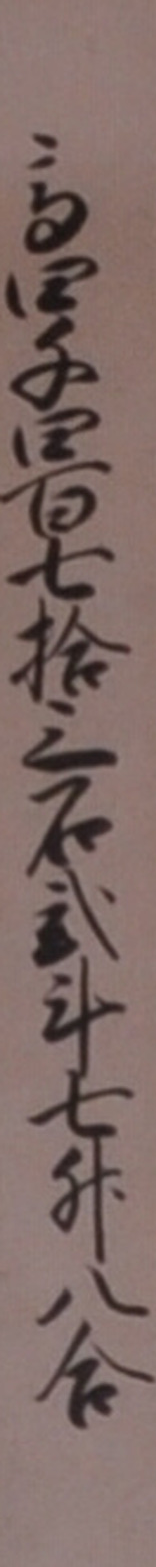高四千四百七拾三石弐斗七升八合
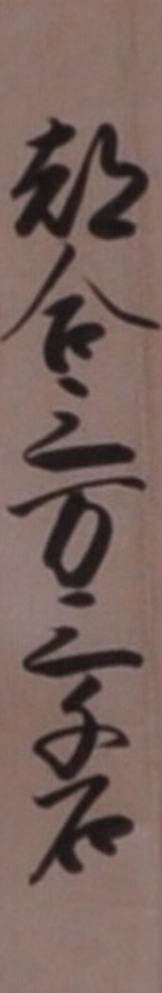都合三万三千石
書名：御朱印写・領地目録
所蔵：伊那市立高遠町図書館・合同会社AMANE
